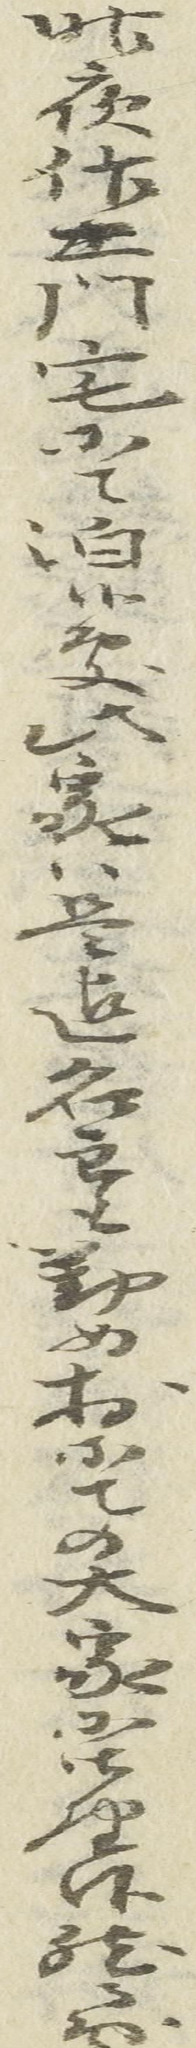一昨夜作エ門宅にて泊候處此家は是迄名主も勤め村にての大家に御座候然る處
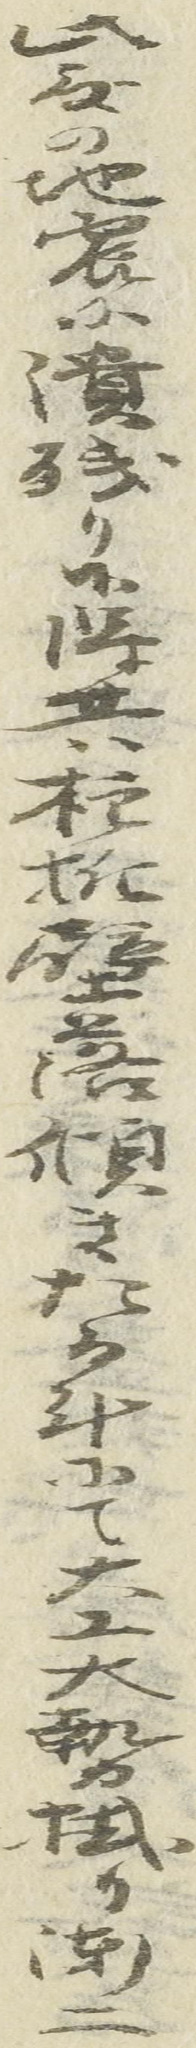此度の地震に潰残り候得共柱折壁落傾きたる斗にて大工大勢掛り漸に
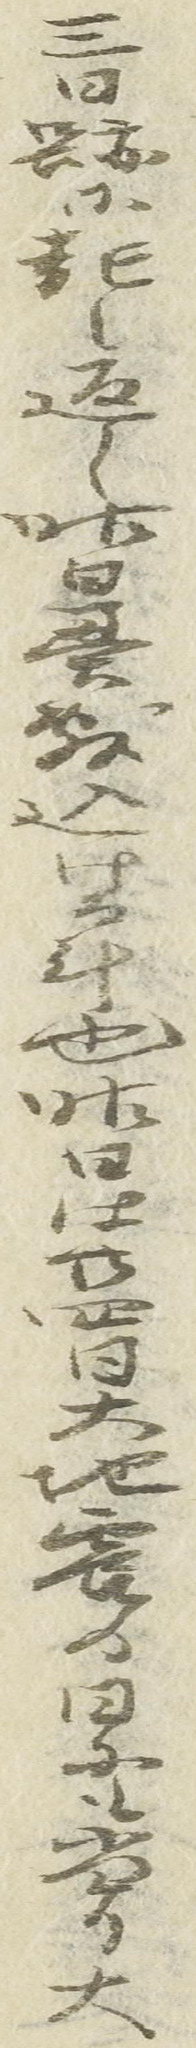三日跡に起し返し昨日畳敷込ける斗也昨日は廿四日大地震の日にも当り大
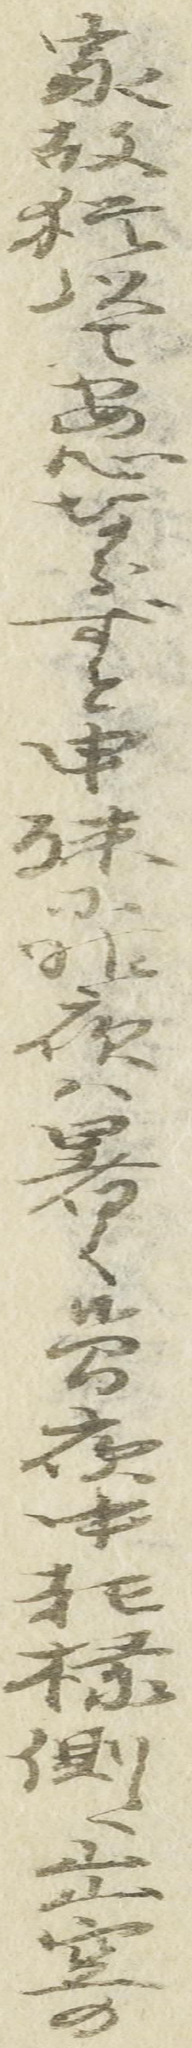家故猶以て安心ならずと申殊に昨夜は暑く候間夜中起縁側へ出空の
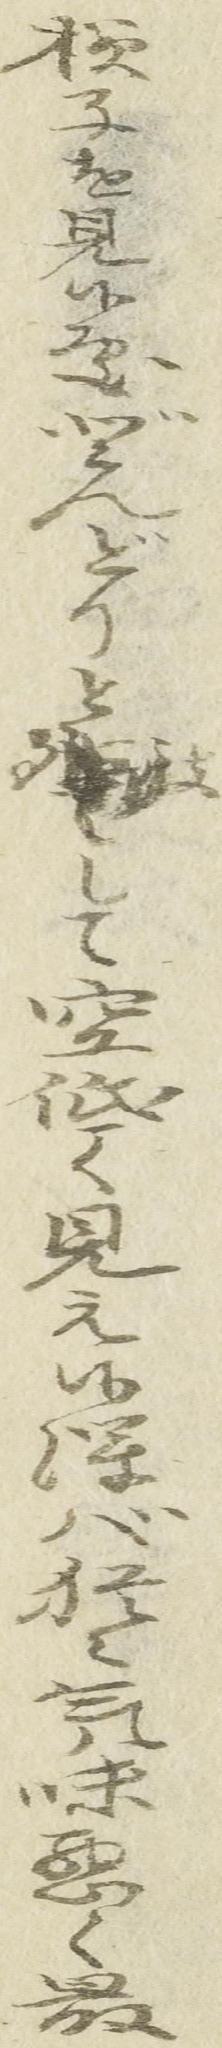様子を見候處どんどりと致して空低く見え候えば猶々気味悪く最
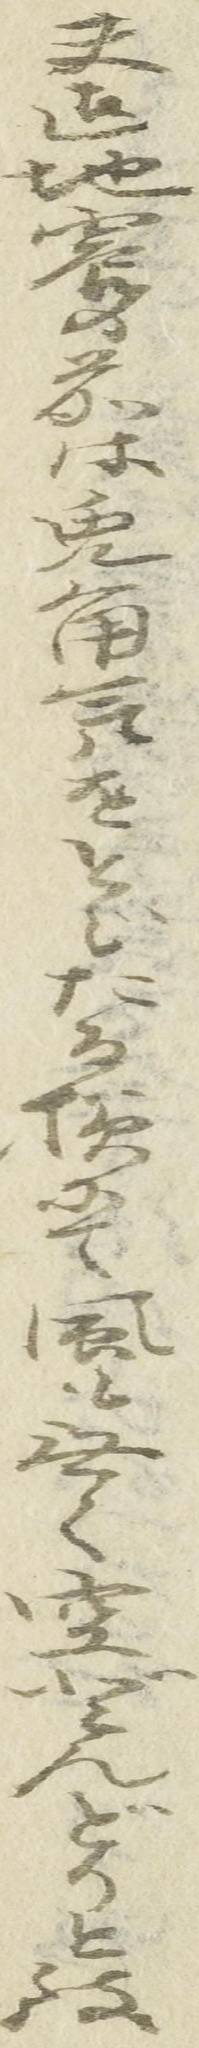夫迄地震の前は兎角気をとじたる様にて風も無く空どんどりと致
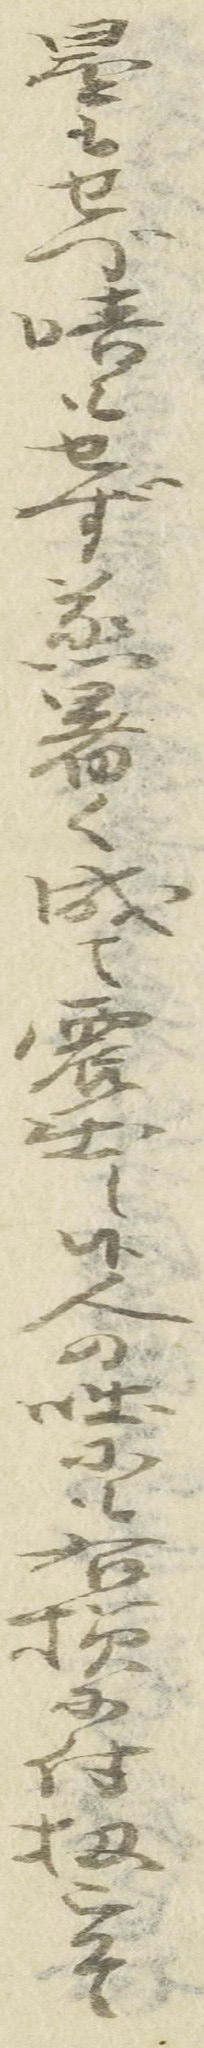曇もせづ晴もせず蒸暑く成て震出し候人の咄にも有様に付扨こそ
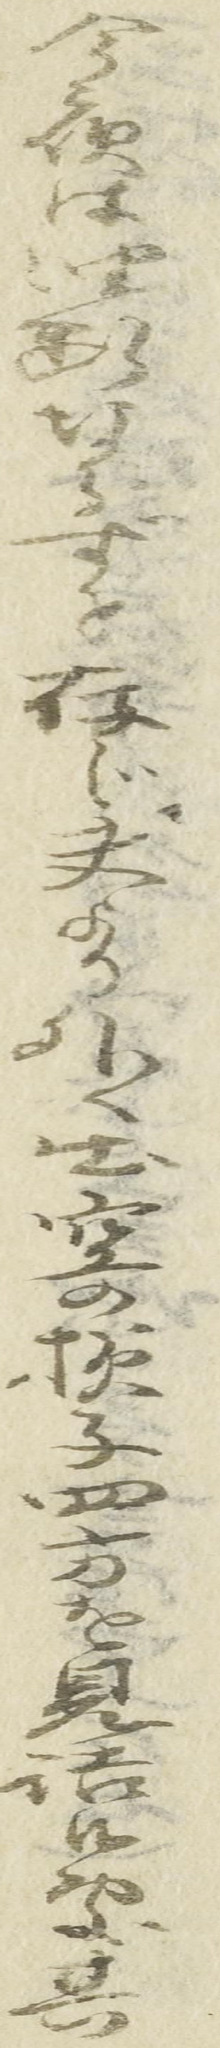今夜は油断ならずと存じ夫より外へ出空の様子四方を見詰候處其
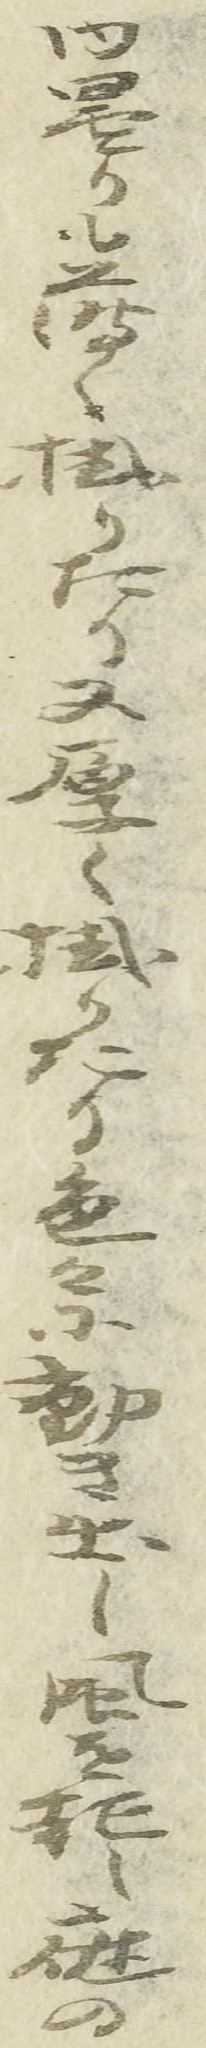内曇りも薄く掛りたり又厚く掛りたり色々に動き出し風を起し庭の
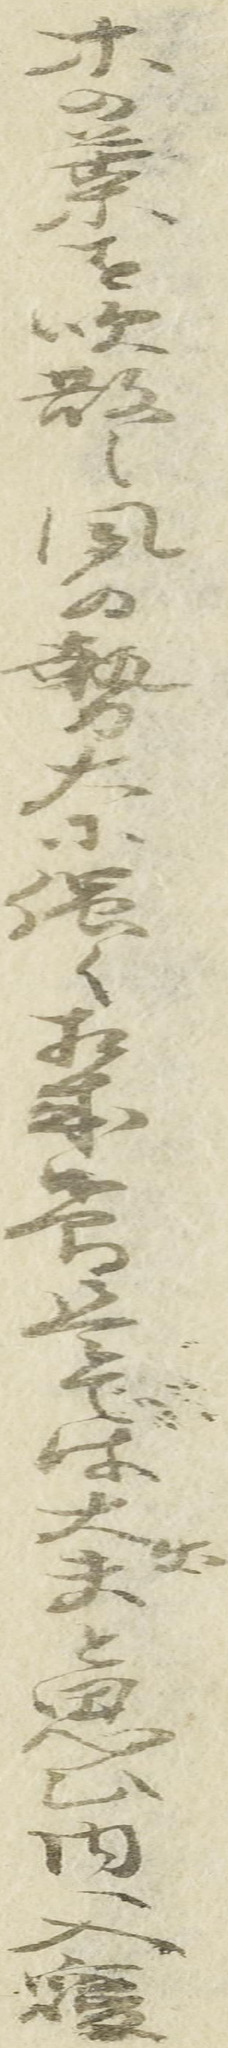木の葉を吹散し風の勢大に強く相成候間是ては大夫と思ひ内へ入寝
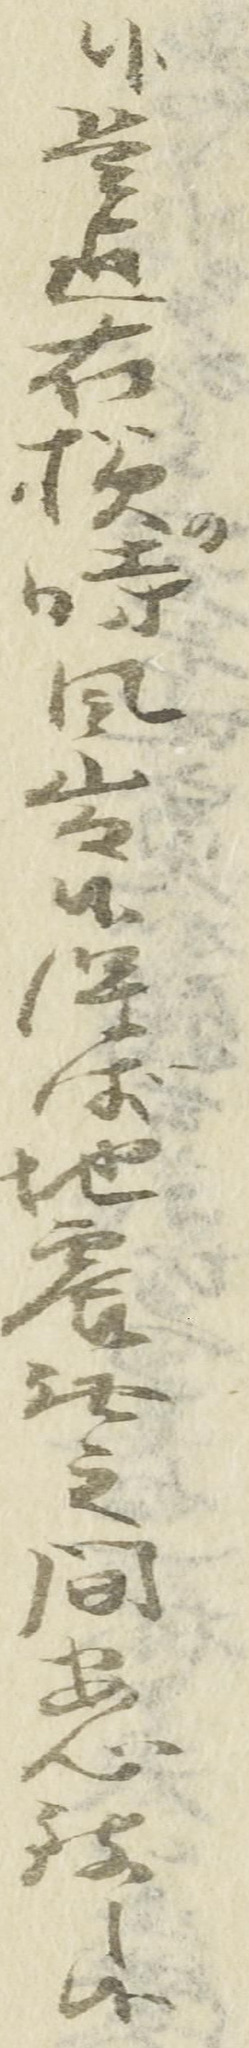候是迄右様時風出候えば地震無之間安心致し候
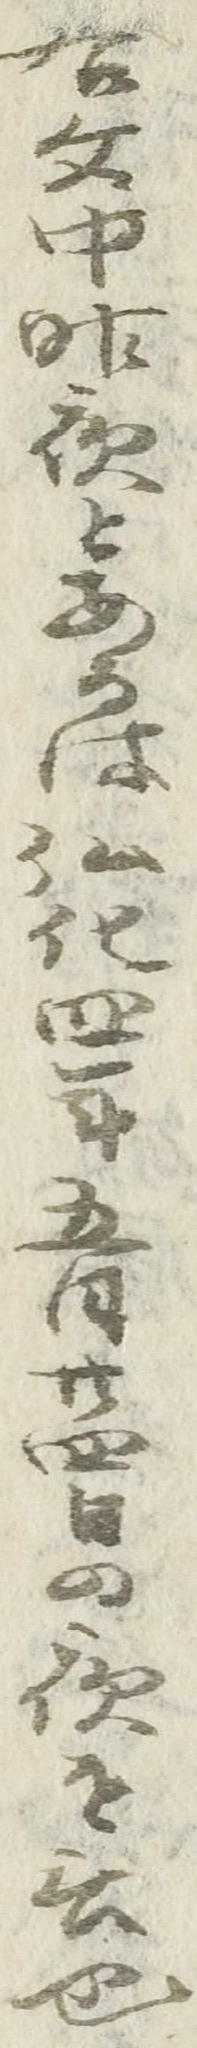右文中昨夜とあるは弘化四年五月廿四日の夜を云也
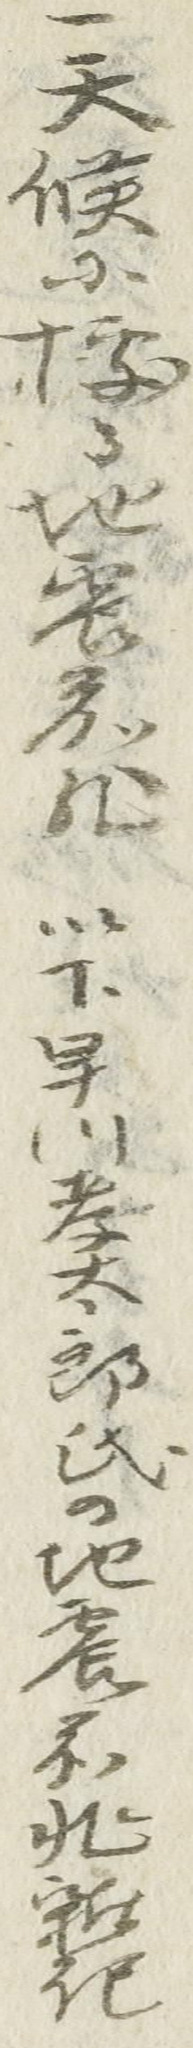一天候に據る地震前兆以下早川孝太郎氏の地震前兆雑記
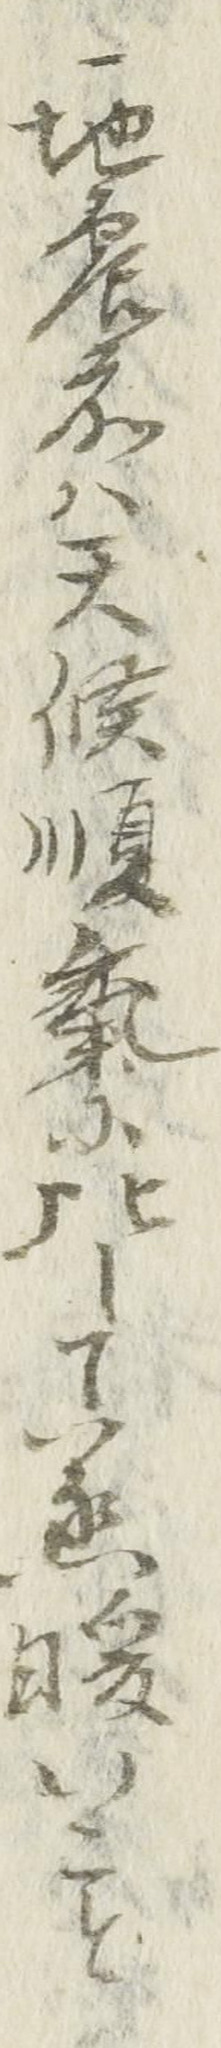一地震前は天候順気に比して蒸暖いこと
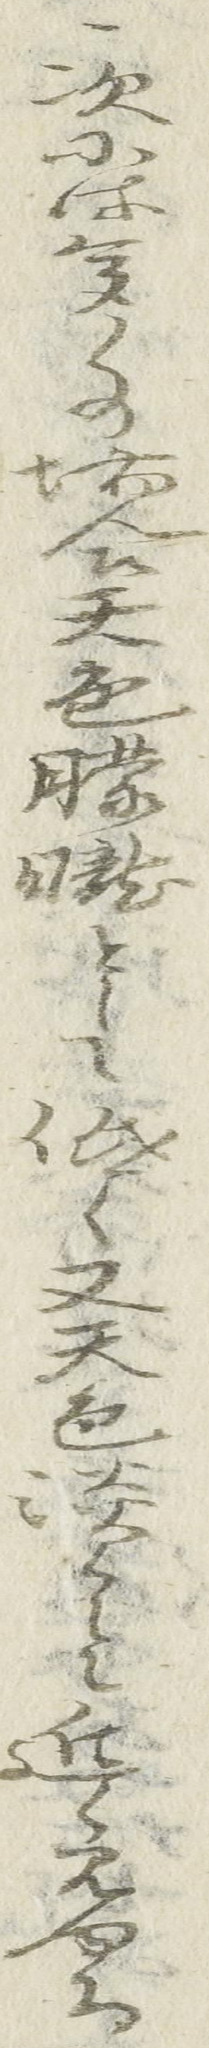一次には多くの場合天色朦朧として低く又天色淡くして近く見ゆる
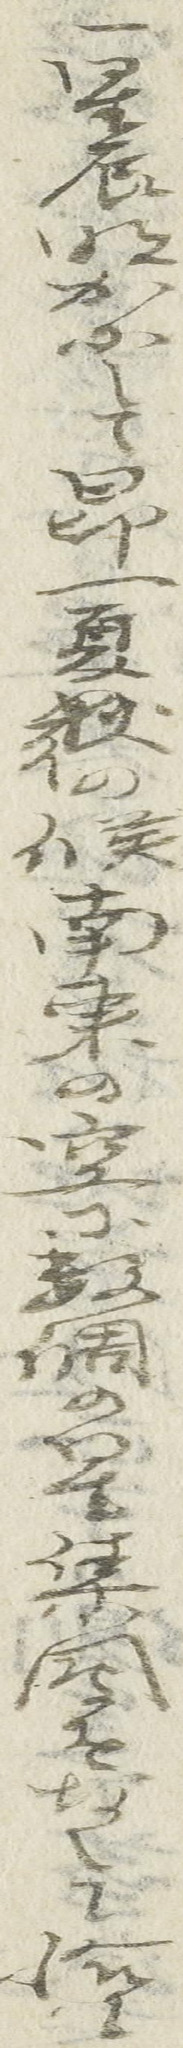一星辰明かにして昴（夏秋の候南東の空に数個の星集団をなして恰も
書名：地震前兆集　全
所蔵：東京大学地震研究所図書室 Earthquake Research Institute Library, The University of Tokyo, JAPAN
